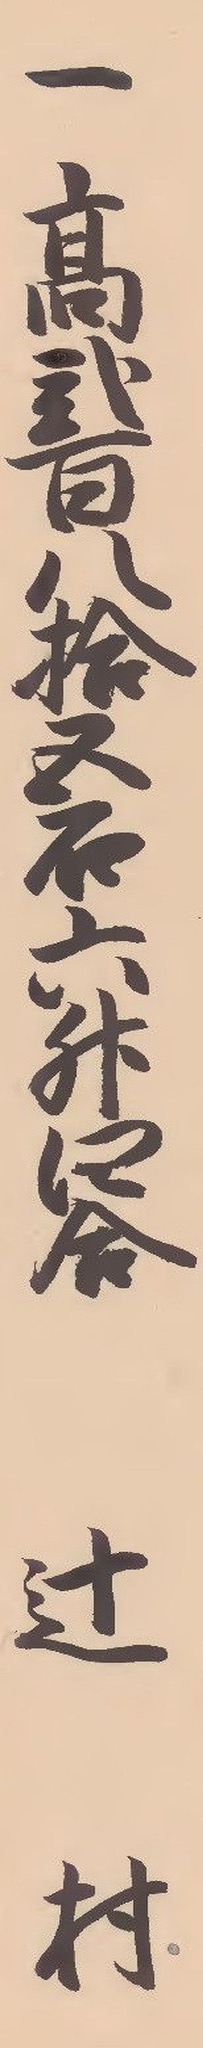一高弐百八拾五石六升四合辻村
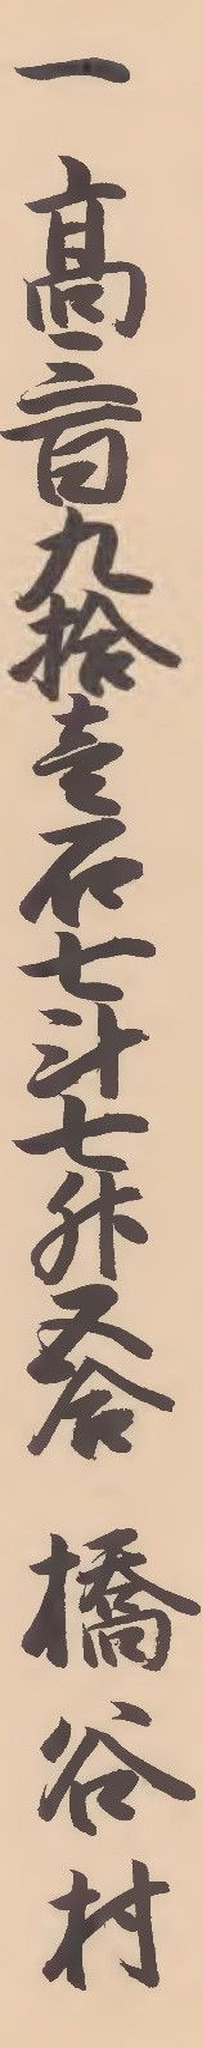一高三百九拾壱石七斗七升五合橋谷村
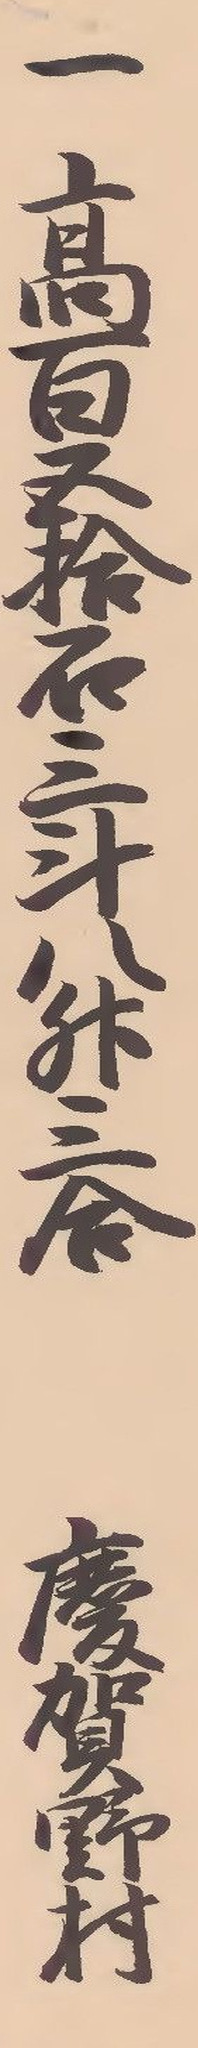一高百五拾石三斗八升三合慶賀野村
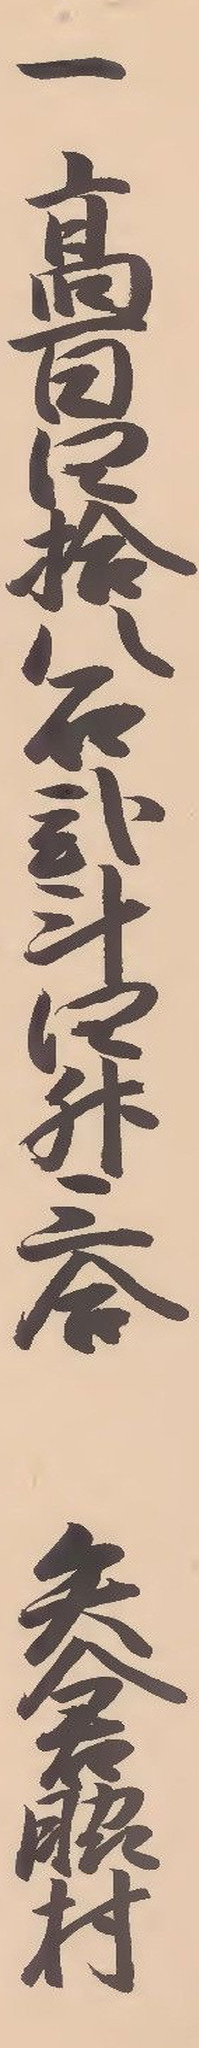一高百四拾八石弐斗四升三合矢倉脇村
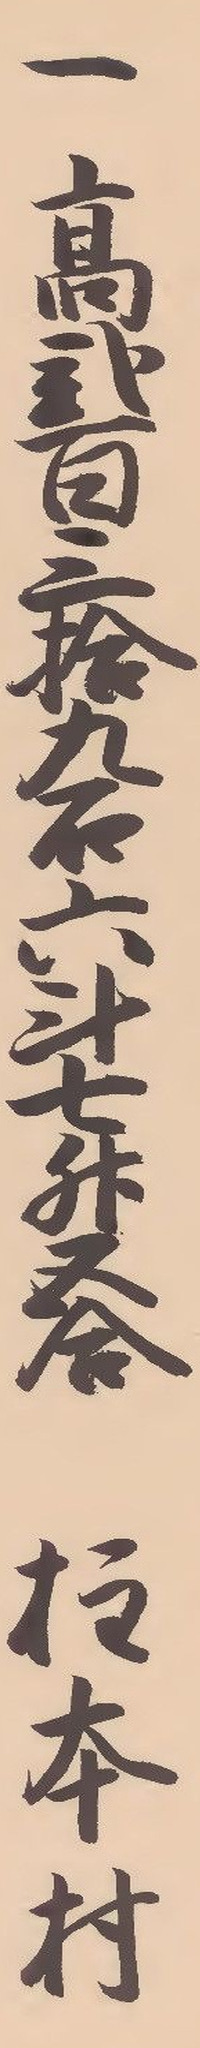一高弐百三拾九石六斗七升五合柱本村
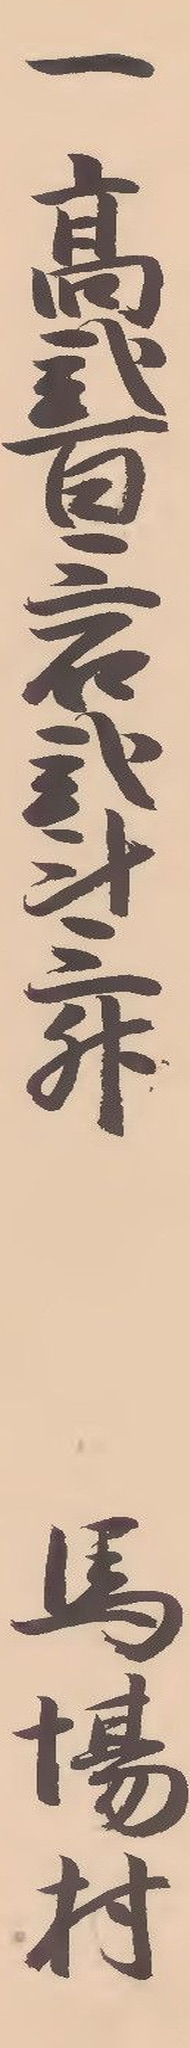一高弐百三石弐斗三升馬場村
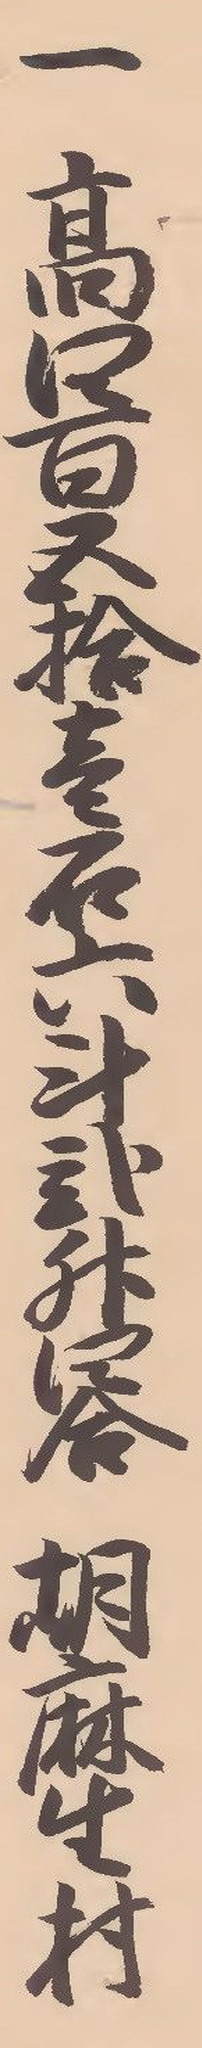一高四百五拾壱石六斗弐升四合胡麻生村

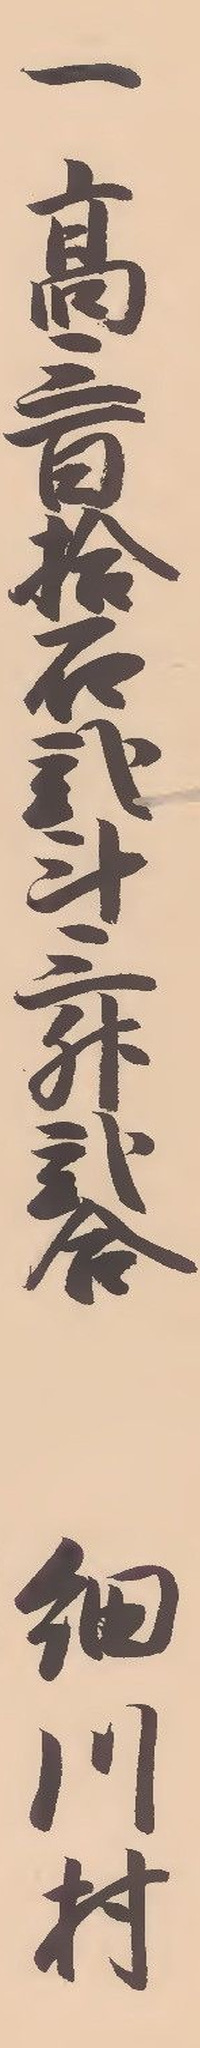一高三百拾石弐斗三升弐合細川村
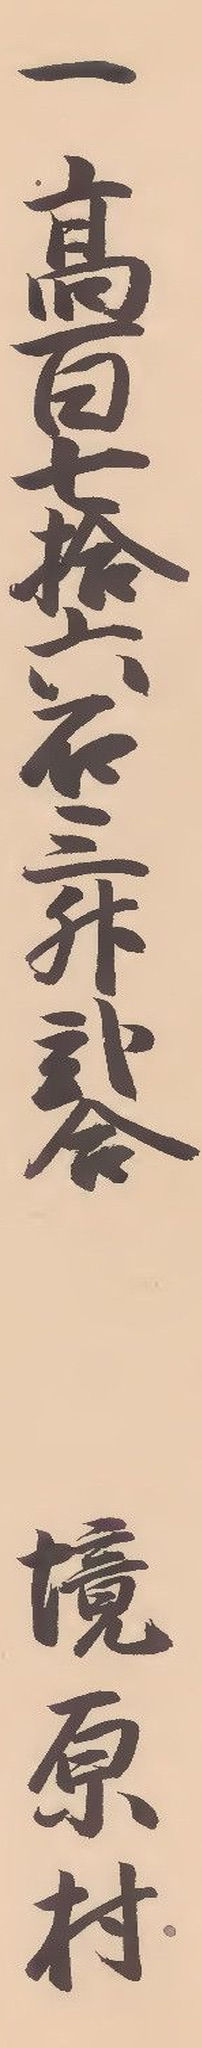一高百七拾六石三升弐合境原村
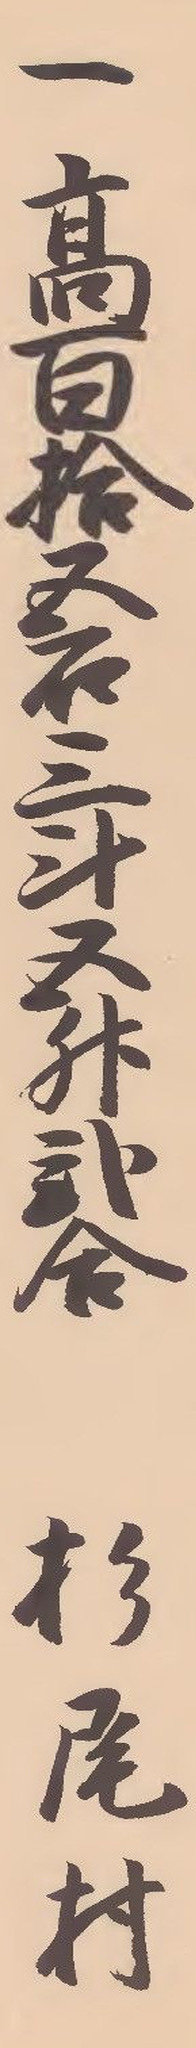一高百拾五石三斗五升弐合杉尾村
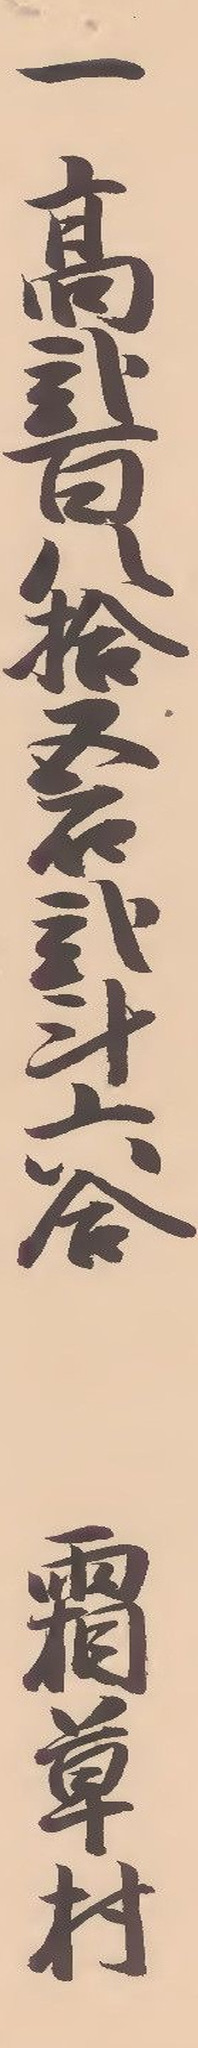一高弐百八拾五石弐斗六合霜草村
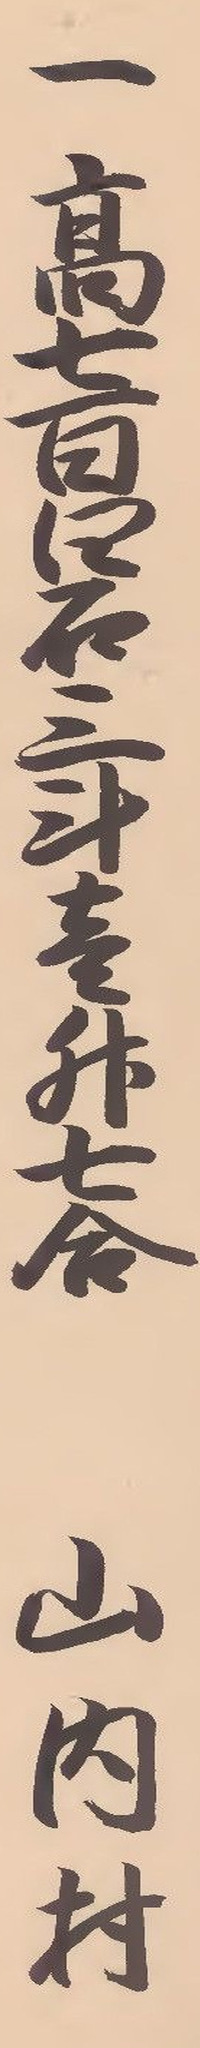一高七百四石三斗壱升七合山内村
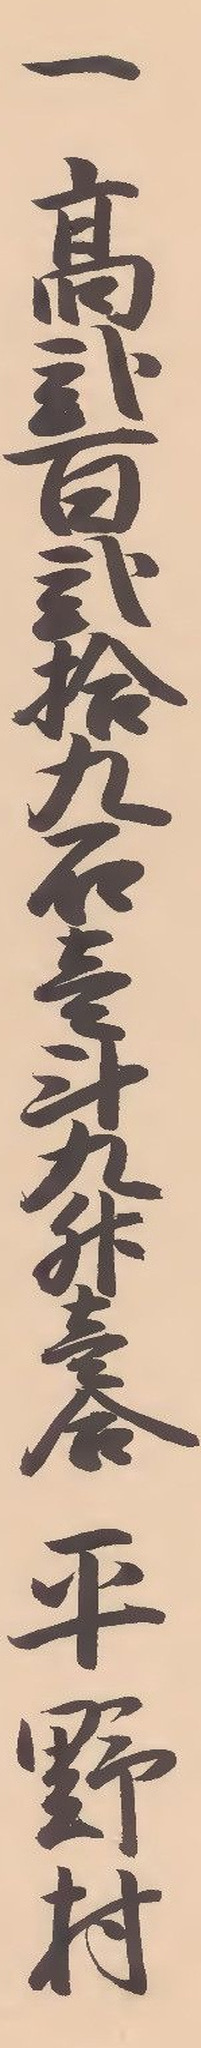一高弐百弐拾九石壱斗九升壱合平野村
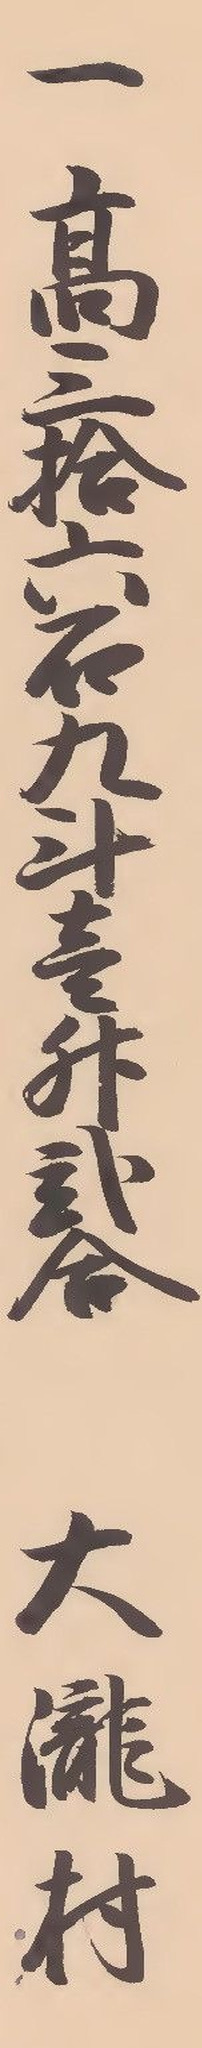一高三拾六石九斗壱升弐合大滝村

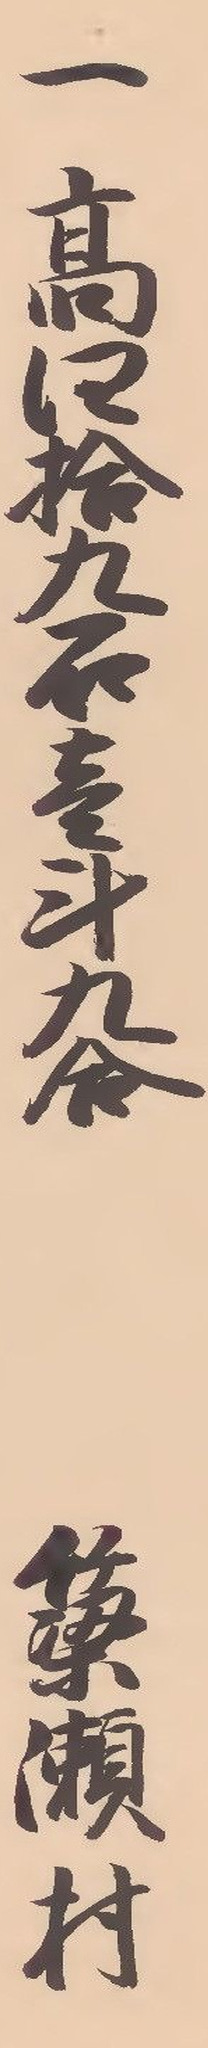一高四拾九石壱斗九合簗瀬村

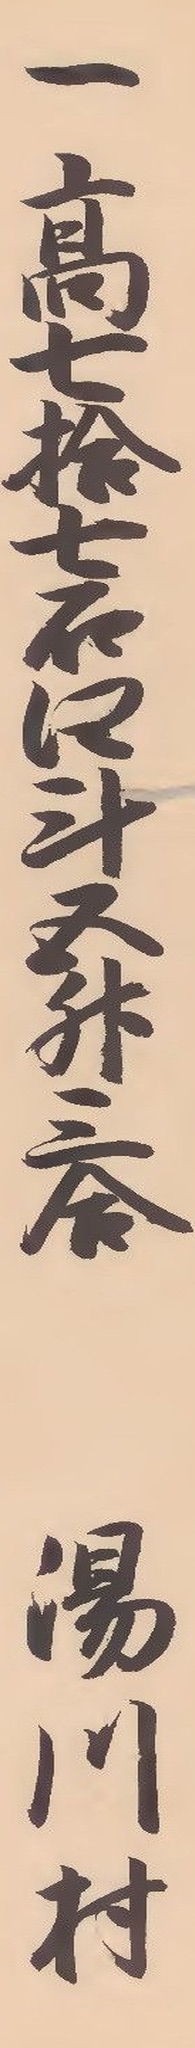一高七拾七石四斗五升三合湯川村
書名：紀伊国郷帳
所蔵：国立公文書館 National Archives of Japan
